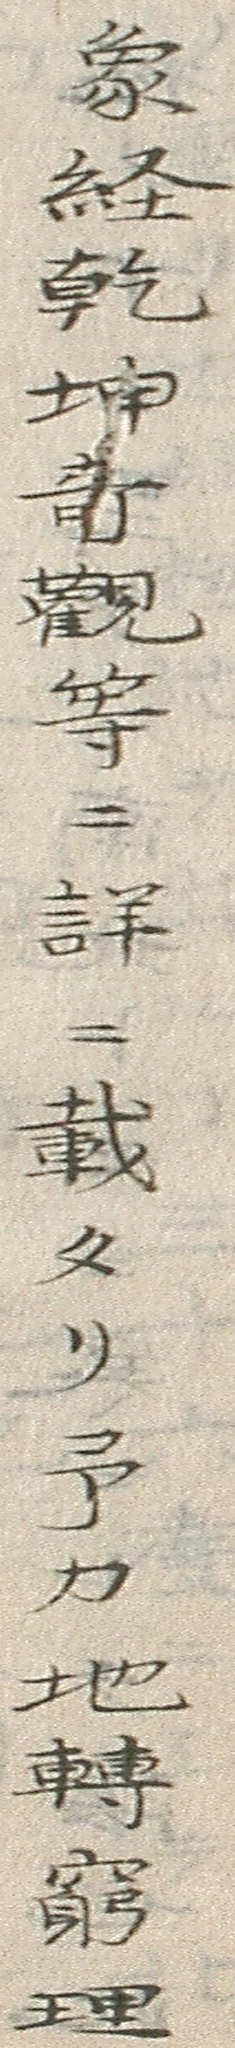象経乾坤奇観等ニ詳ニ載タリ予カ地転窮理
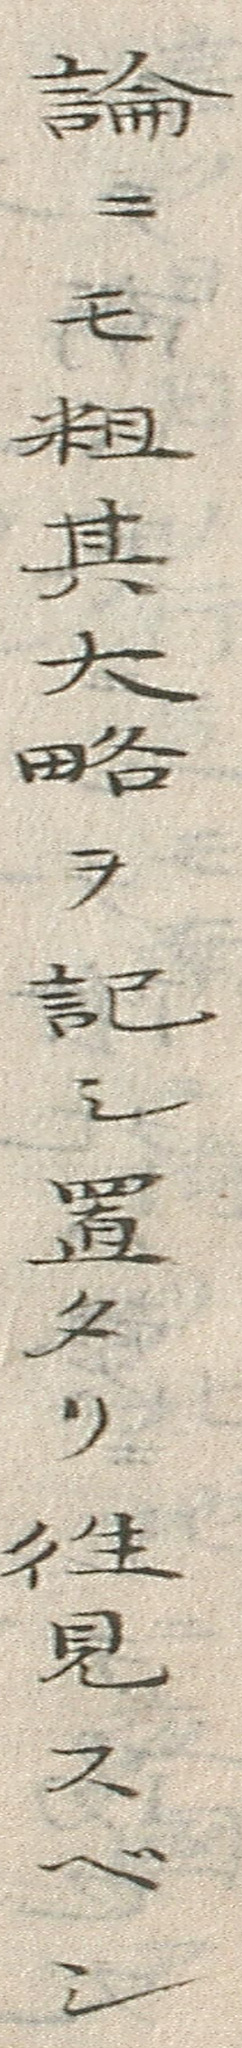論ニモ粗其大略ヲ記シ置タリ徃見スベシ
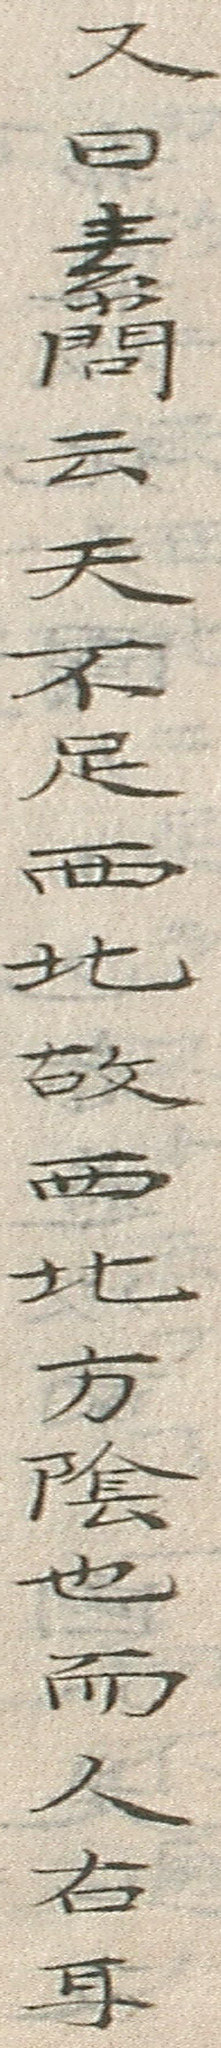又曰素問云天不足西北故西北方陰也而人右耳
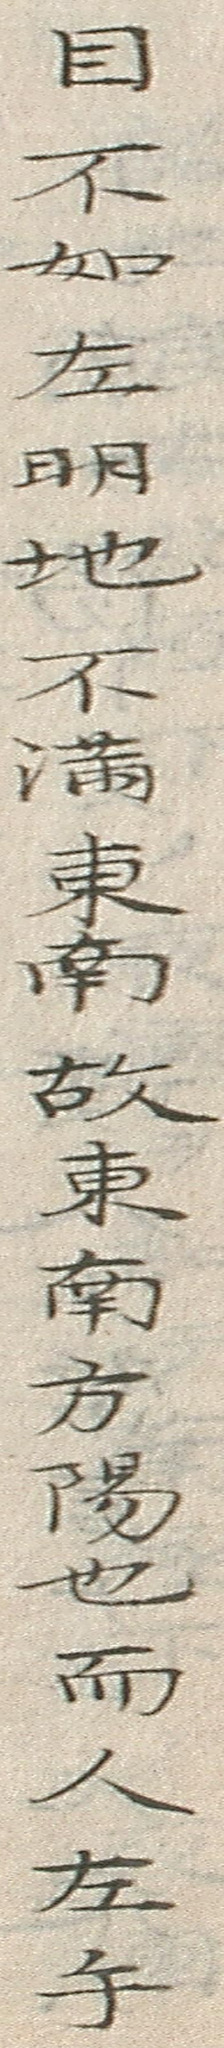目不如左明地不満東南故東南方陽也而人左手
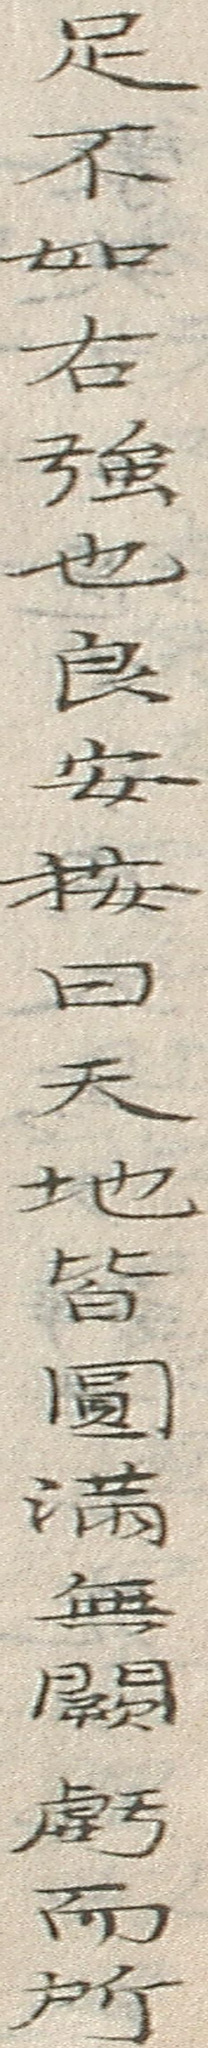足不如右強也良安按曰天地皆円満無闕虧而所
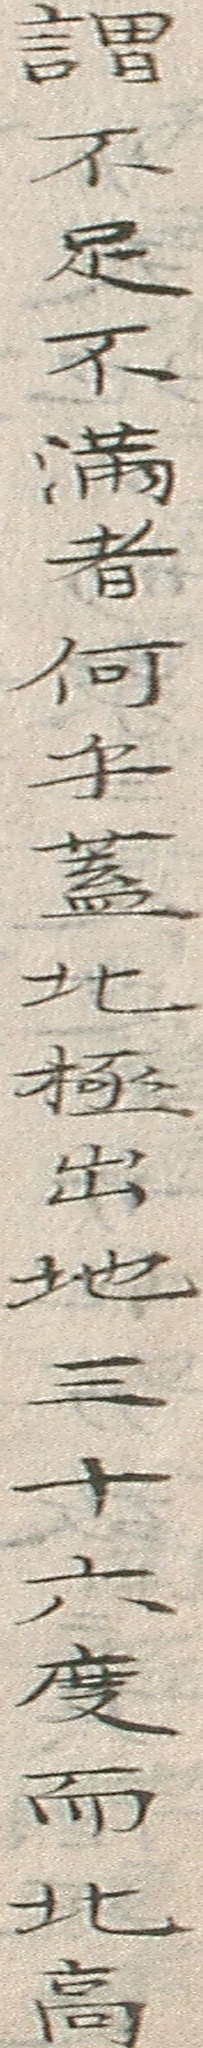謂不足不満者何乎蓋北極出地三十六度而北高
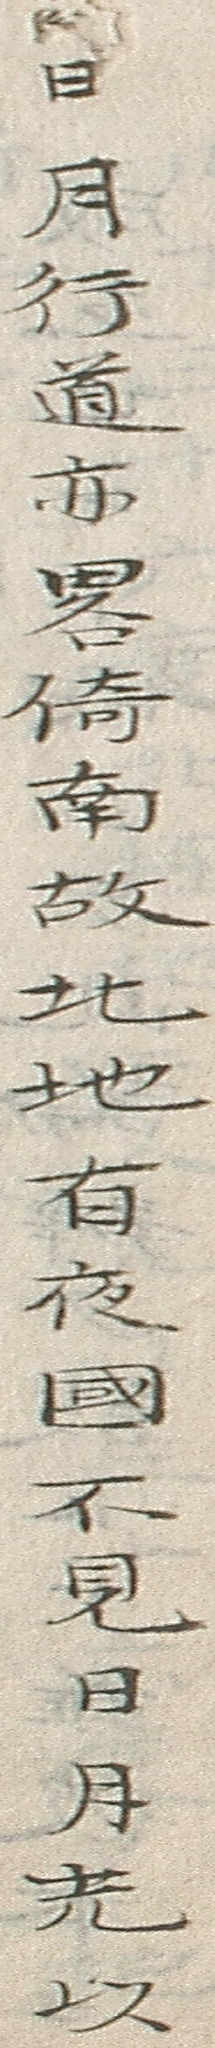日月行道亦略倚南故北地有夜国不見日月光以
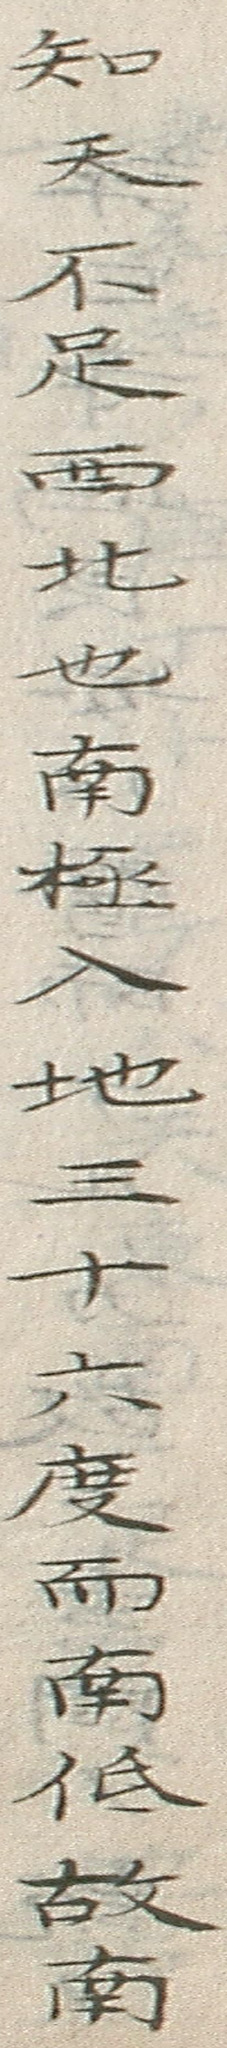知天不足西北也南極入地三十六度而南低故南
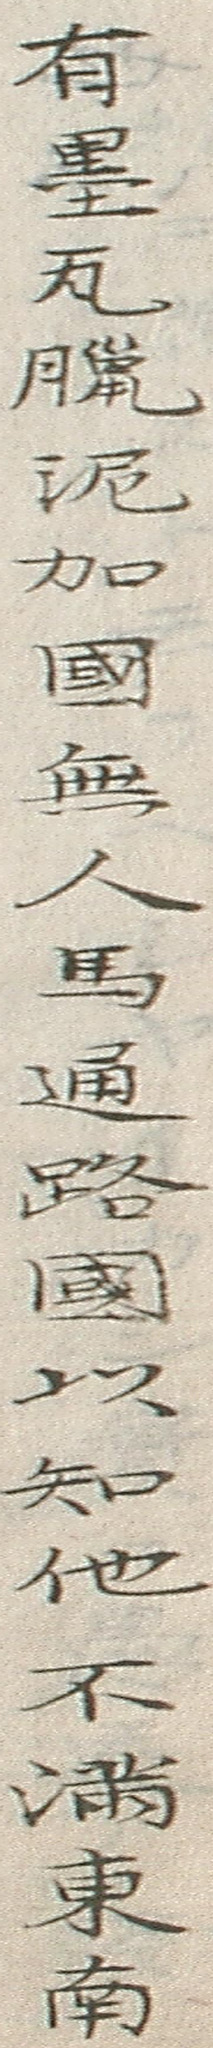有墨瓦臘泥加国無人馬通路国以知他不満東南

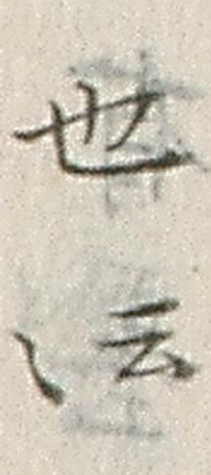也云〻
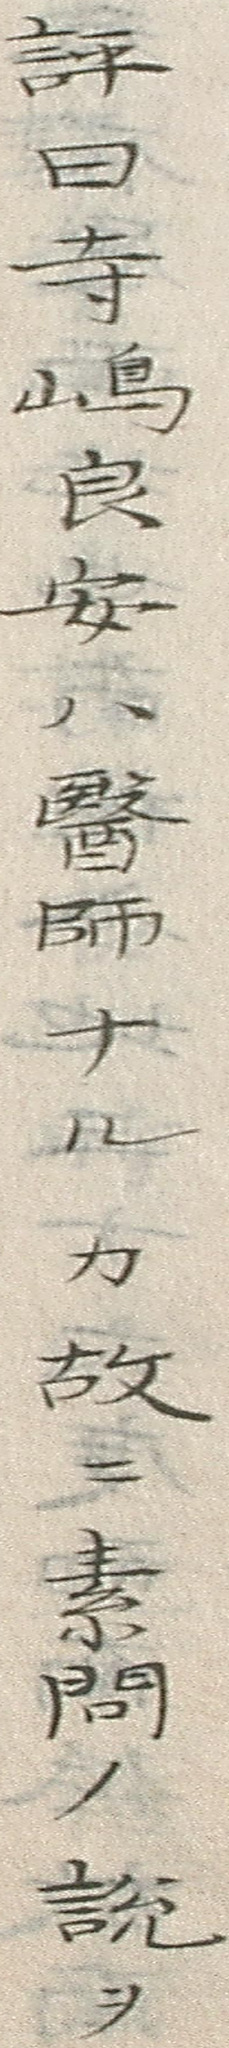評曰寺嶋良安ハ医師ナルカ故ニ素問ノ説ヲ
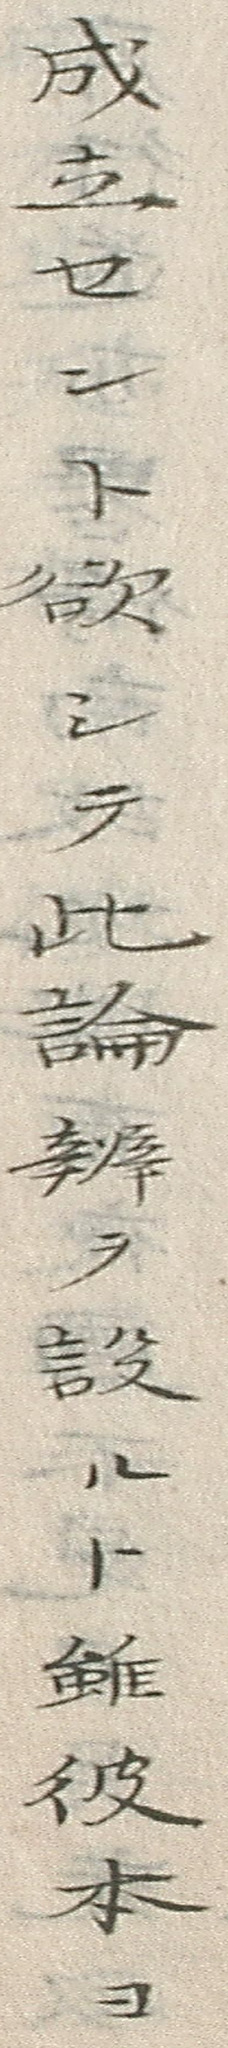成立セント欲シテ此論弁ヲ設ルト雖彼本ヨ
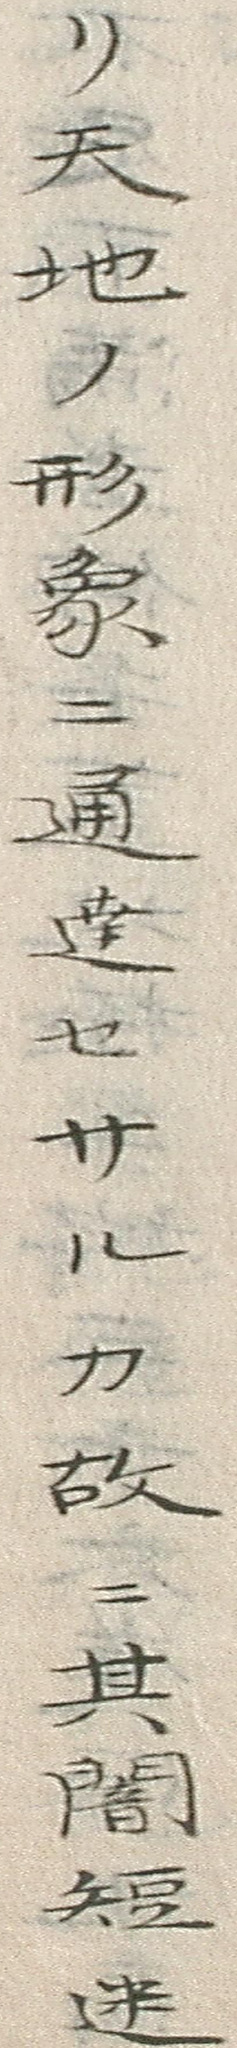リ天地ノ形象ニ通達セサルカ故ニ其闇短迷
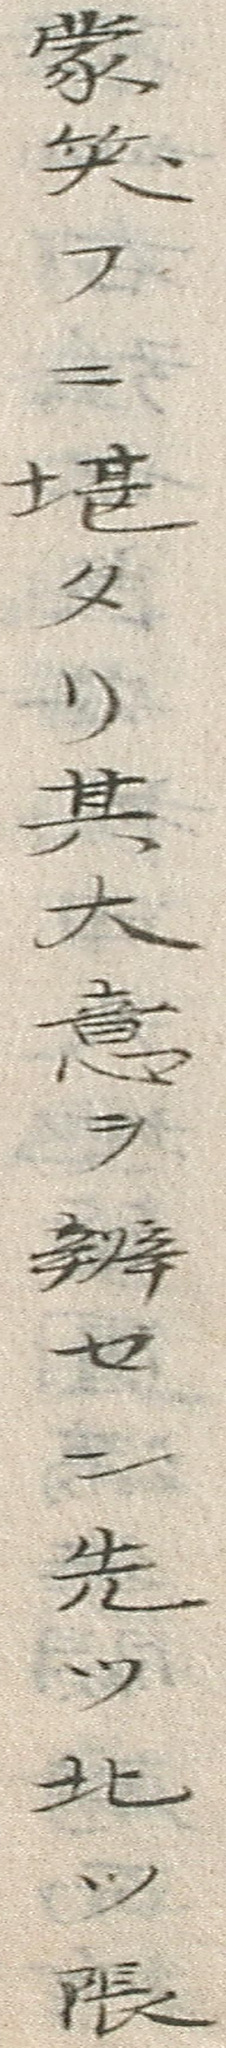蒙笑フニ堪タリ其大意ヲ弁セン先ツ北ツ陰
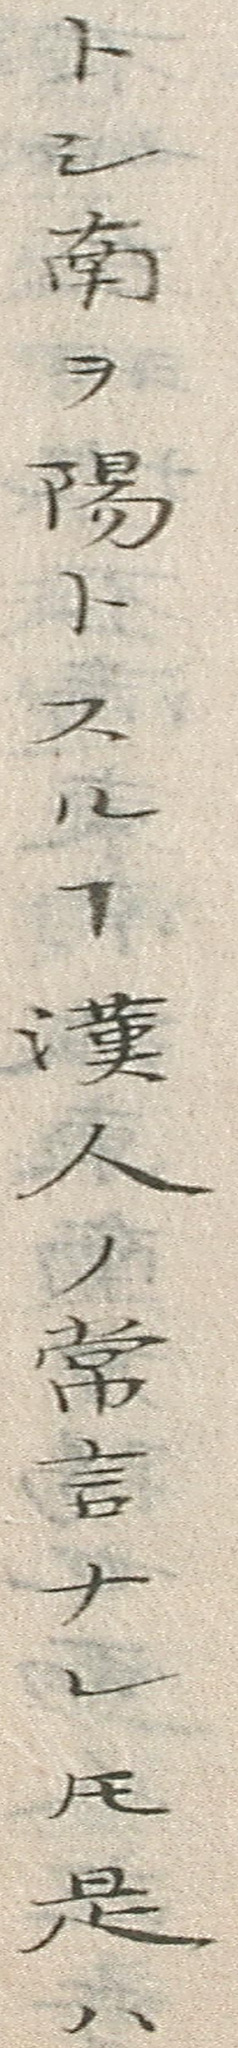トシ南ヲ陽トスルコト漢人ノ常言ナレトモ是ハ
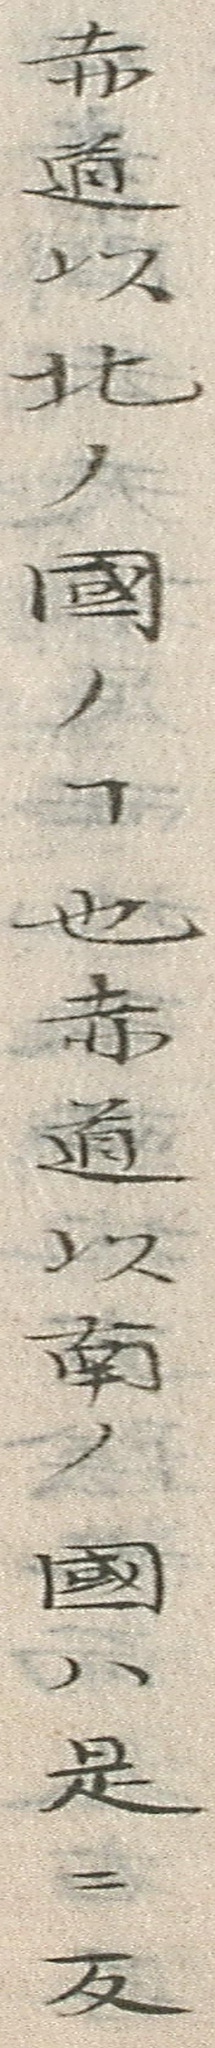赤道以北ノ国ノコト也赤道以南ノ国ハ是ニ反
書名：天學略名目羽翼　全
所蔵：東京大学地震研究所図書室 Earthquake Research Institute Library, The University of Tokyo, JAPAN
